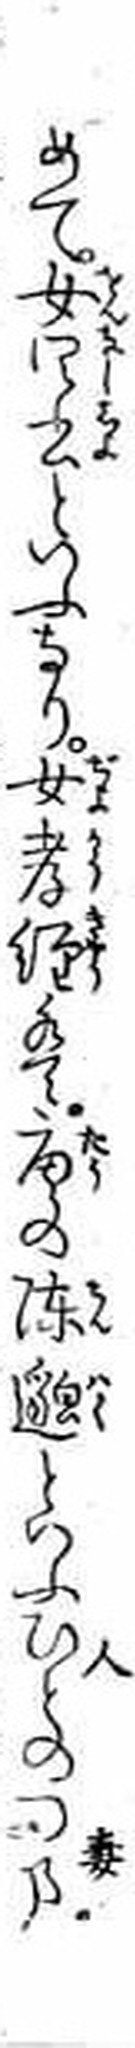めて。女四書といふなり。女考経は。唐の陳邈といふひとのつま。
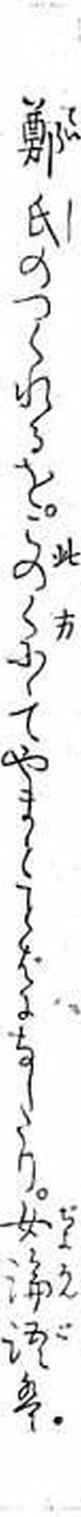鄭氏のつくれるを。このくにゝてやまとことばになしたり。女論語は。
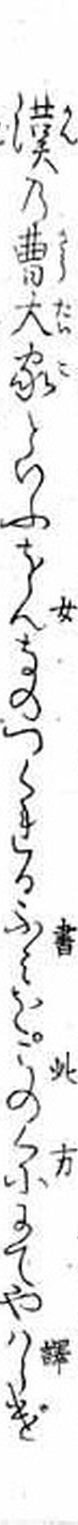漢の曹大家といふをんなのつくれるふみを。このくににてやはらげ
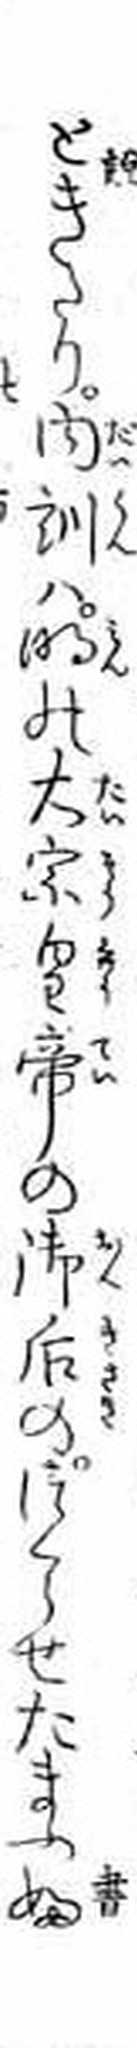ときたり。内訓は。明の大宗皇帝の御后の。つくらせたまふふ
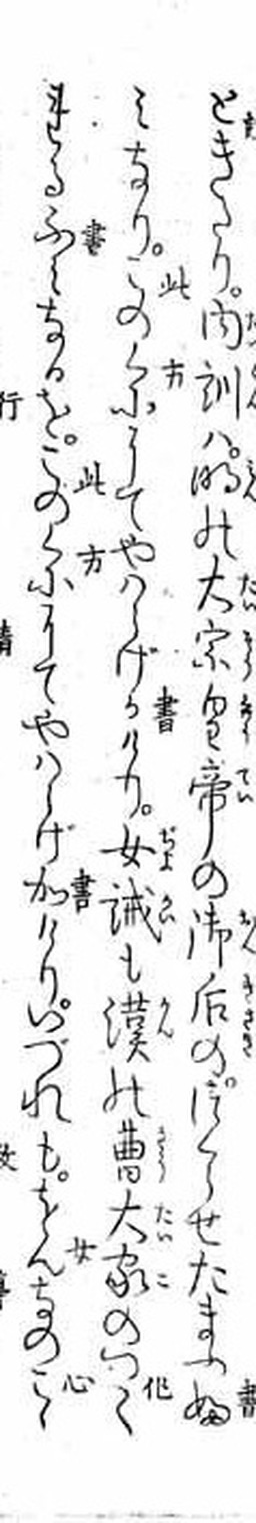みなり。このくににてやはらげかけり。女誡も漢の曹大家のつく
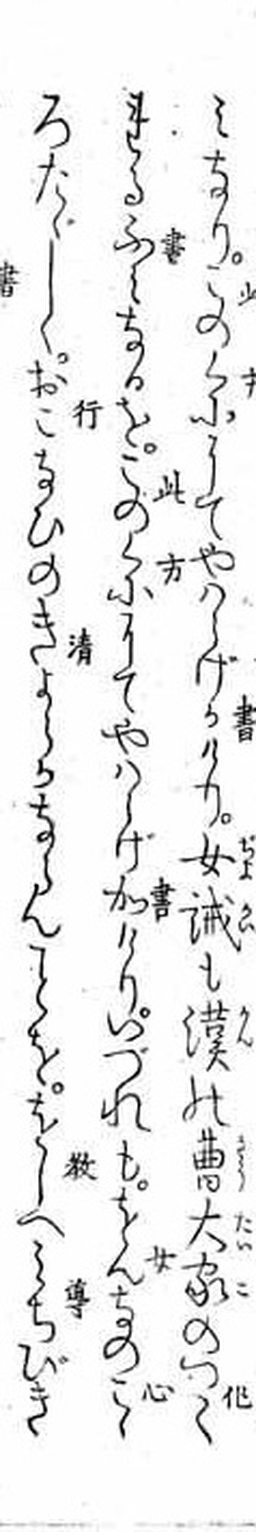れるふみなるを。このくににてやはらげかけり。いづれも。をんなのこゝ
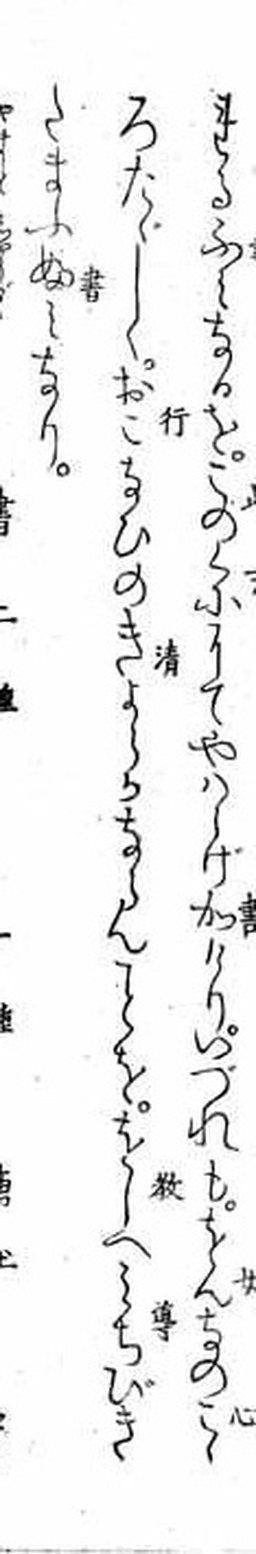ろたヾしく。おこなひのきよらかならんことを。をしへみちびき
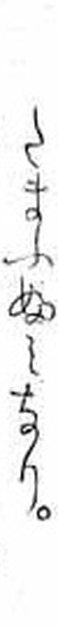たまふふみなり。
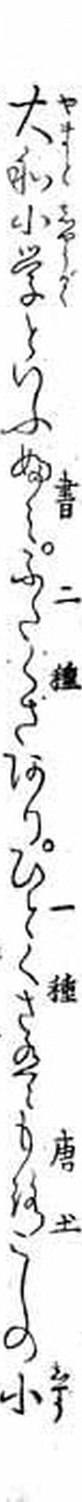大和小学といふふみ。ふたくさあり。ひとくさはもろこしの小
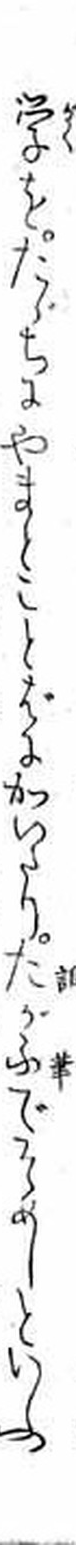学を。たヾちにやまとことばにかいたり。たがふでそめしといふ
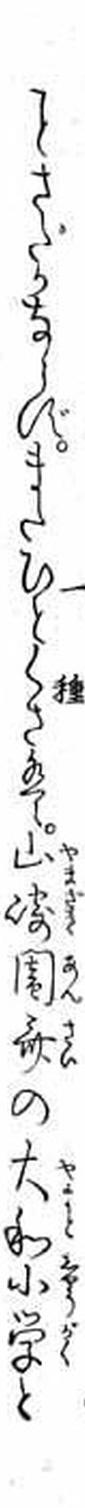ことさだかならず。またひとくさは。山崎闇斎の大和小学と

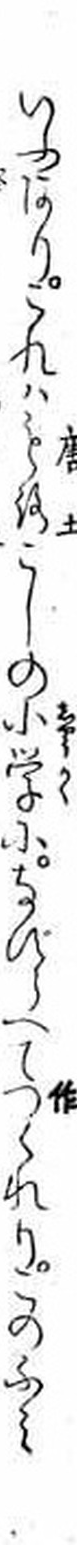いふあり。これはもろこしの小学に。なずらへてつくれり。このふみ
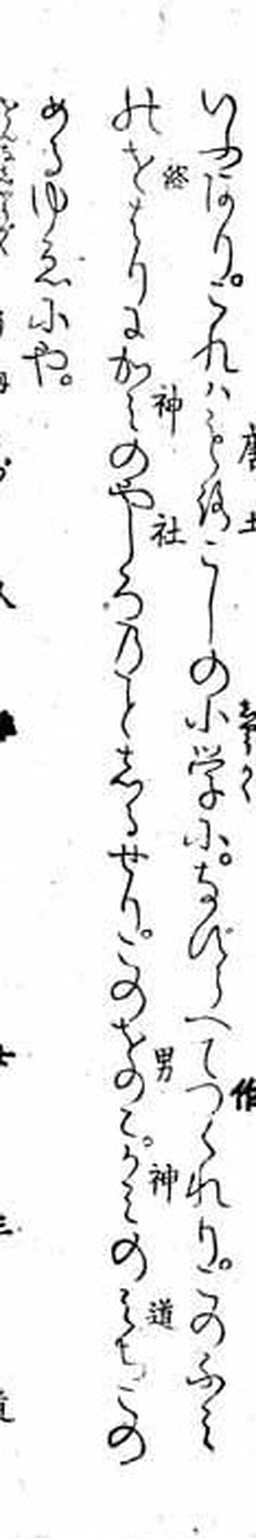のをはりにかみのやしろのことしるせり。このをのこ。かみのみちこの
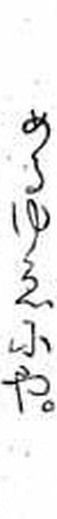めるゆえにや。
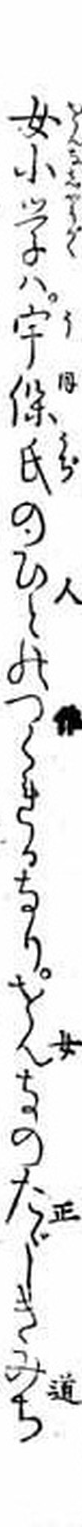女小学は。宇保氏のひとのつくれるなり。をんなのたヾしきみち
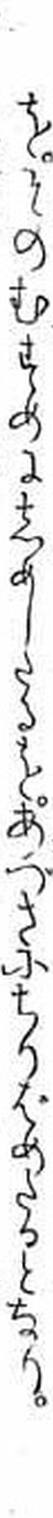を。そのむすめにしめしたるを。あづさにちりばめたるとなり。
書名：女学範
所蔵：東京学芸大学教育コンテンツアーカイブ
